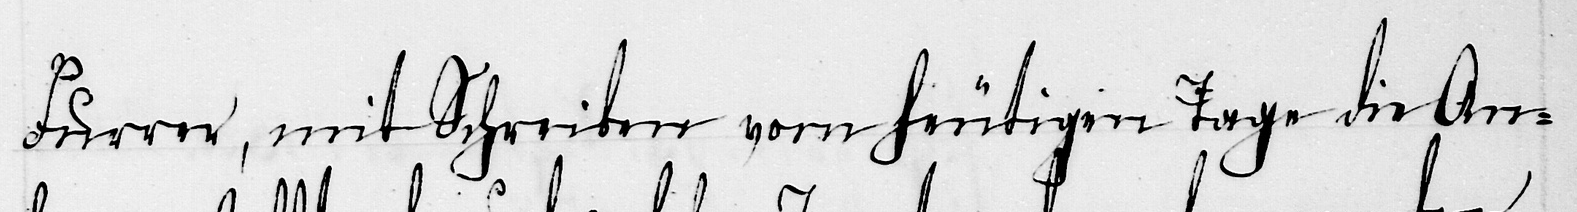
Furrer, mit Schreiben vom heutigen Tage die An¬
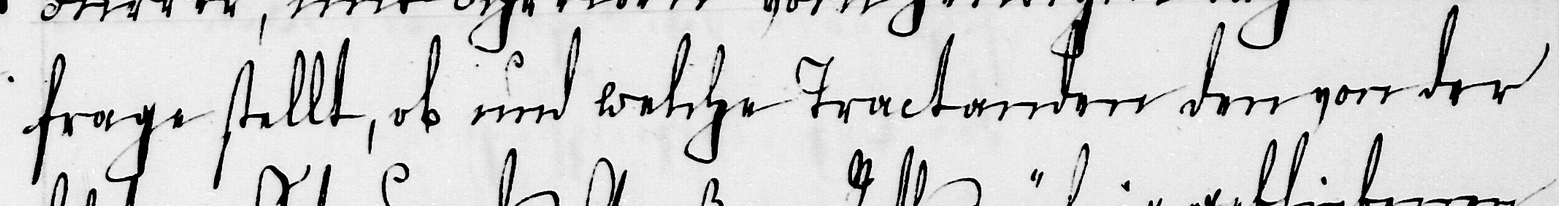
frage stellt, ob und welche Tractanden den von der
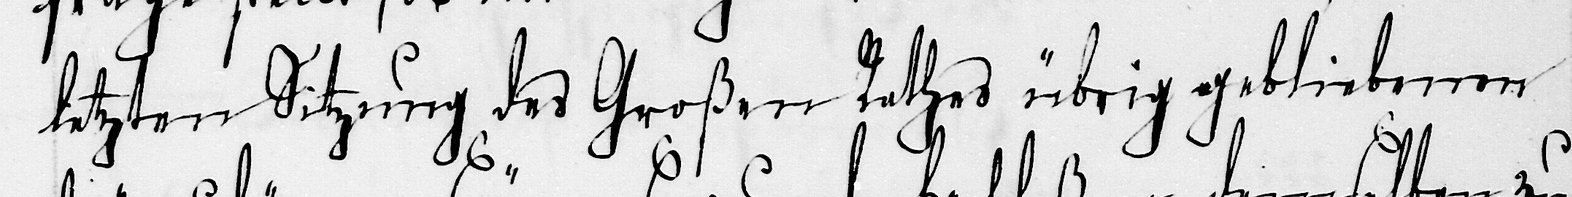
letzten Sitzung des Großen Rathes übrig gebliebenen
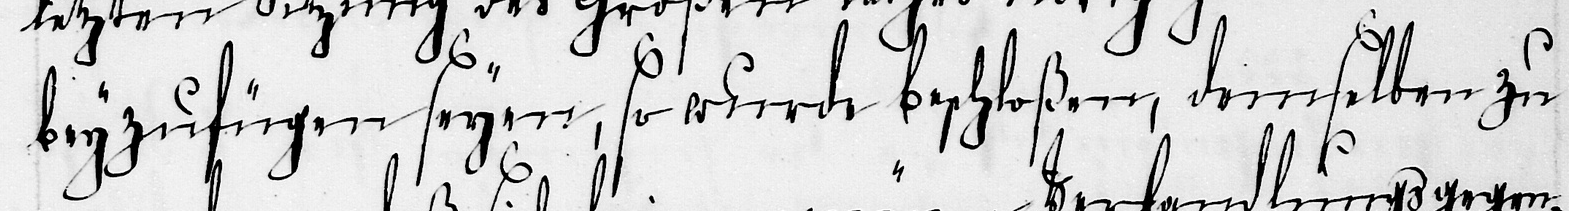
beyzufügen seyen, so wurde beschloßen, demselben zu
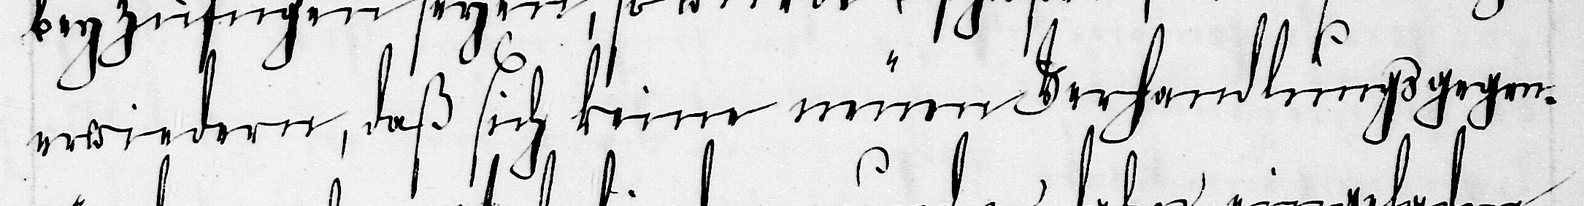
erwiedern, daß sich keine neuen Verhandlungsgegen¬
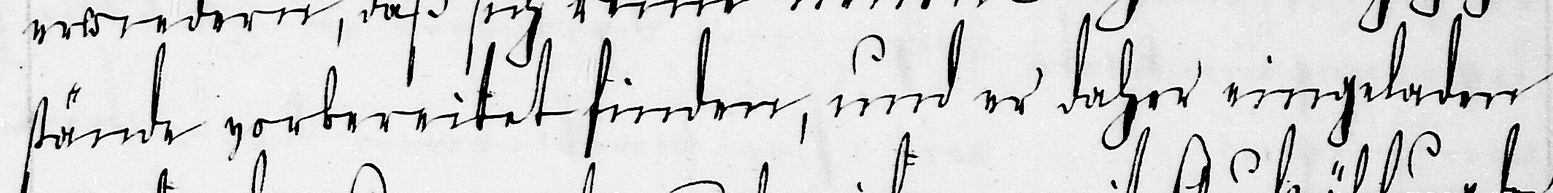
stände vorbereitet finden, und er daher eingeladen
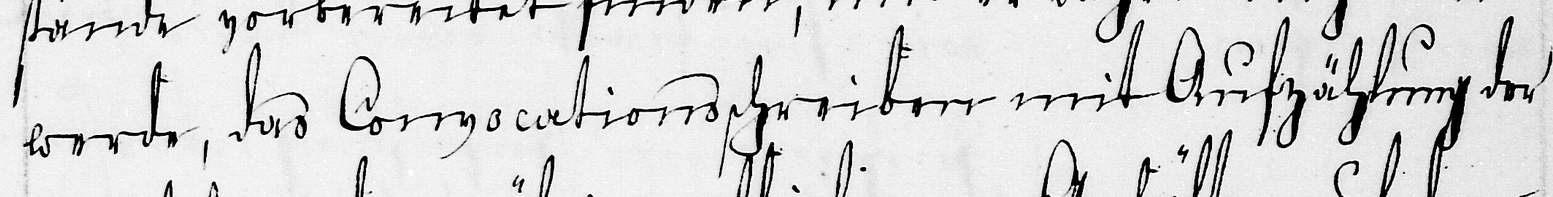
werde, das Convocationsschreiben mit Aufzählung der
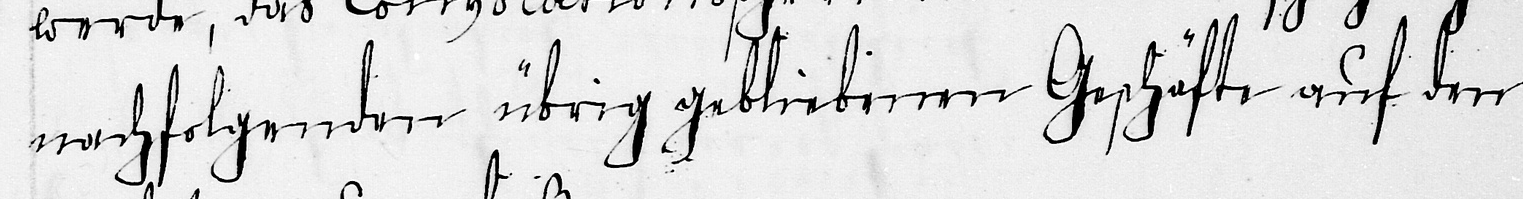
nachfolgenden übrig gebliebenen Geschäfte auf den
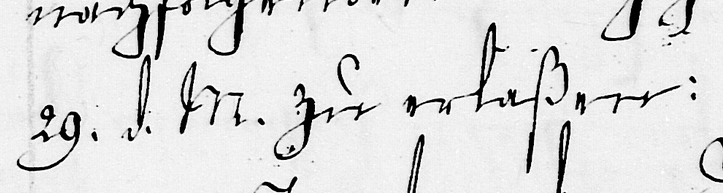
29. d. M. zu erlaßen:
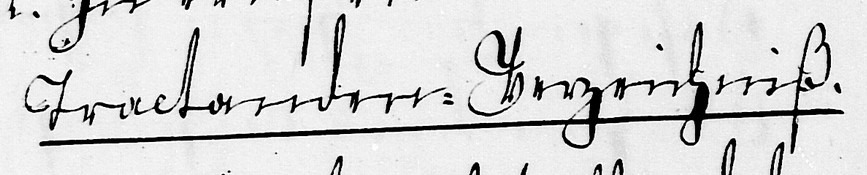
Tractanden-Verzeichniß.
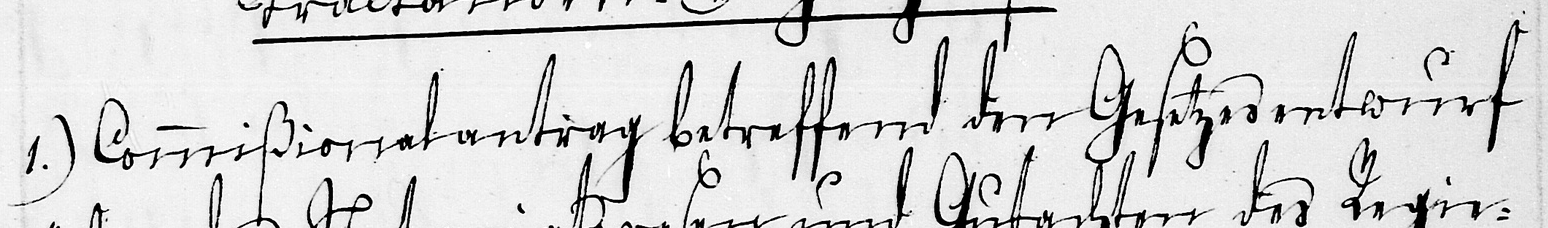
1.) Commißionalantrag betreffend den Gesetzesentwurf
